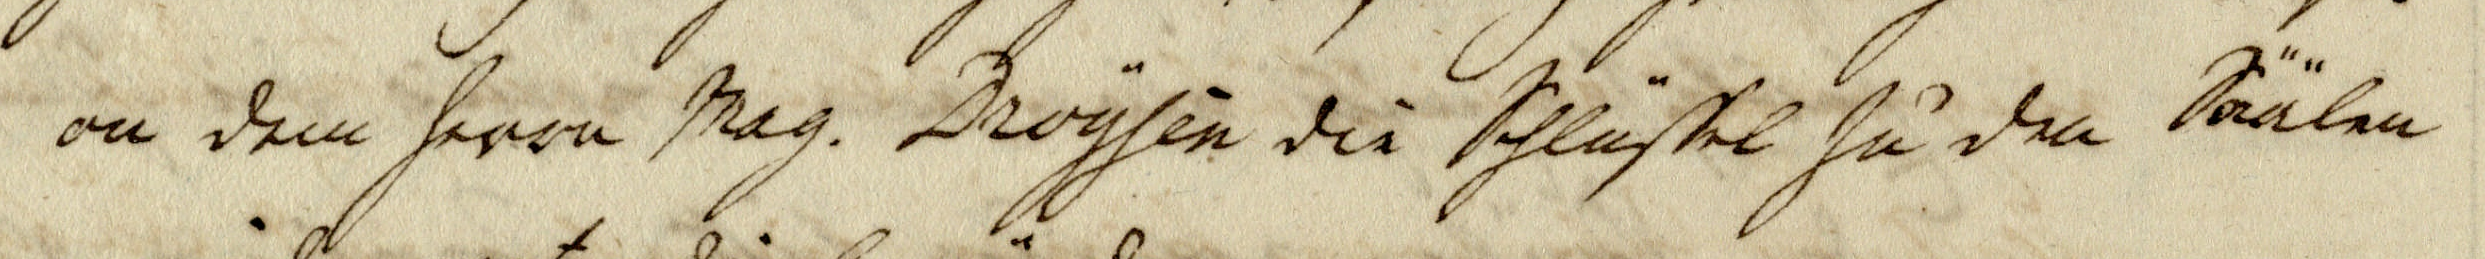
on dem Herrn Mag. Droÿsen die Schlüssel zu den Säälen
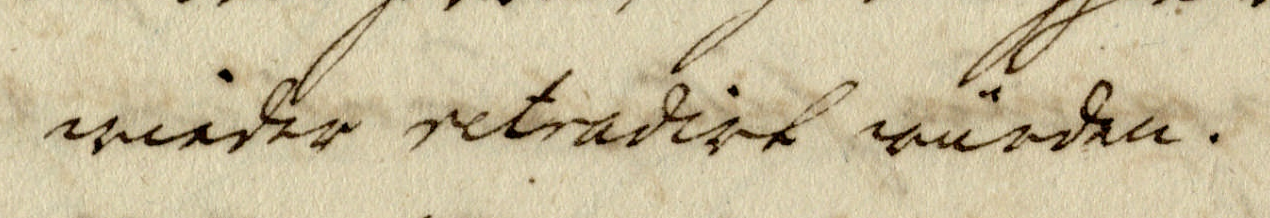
wieder retradirt würden.
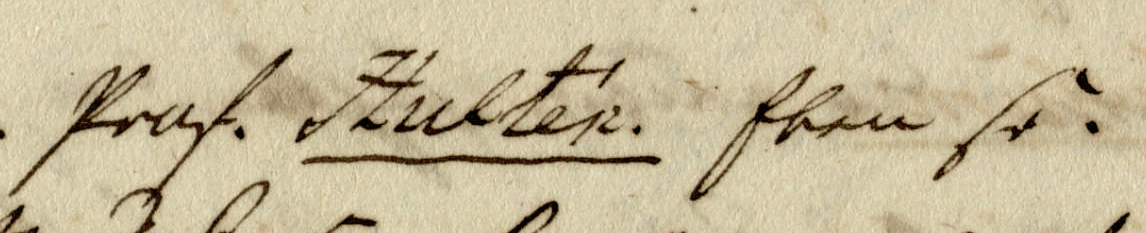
Prof. Hultén. Eben so.
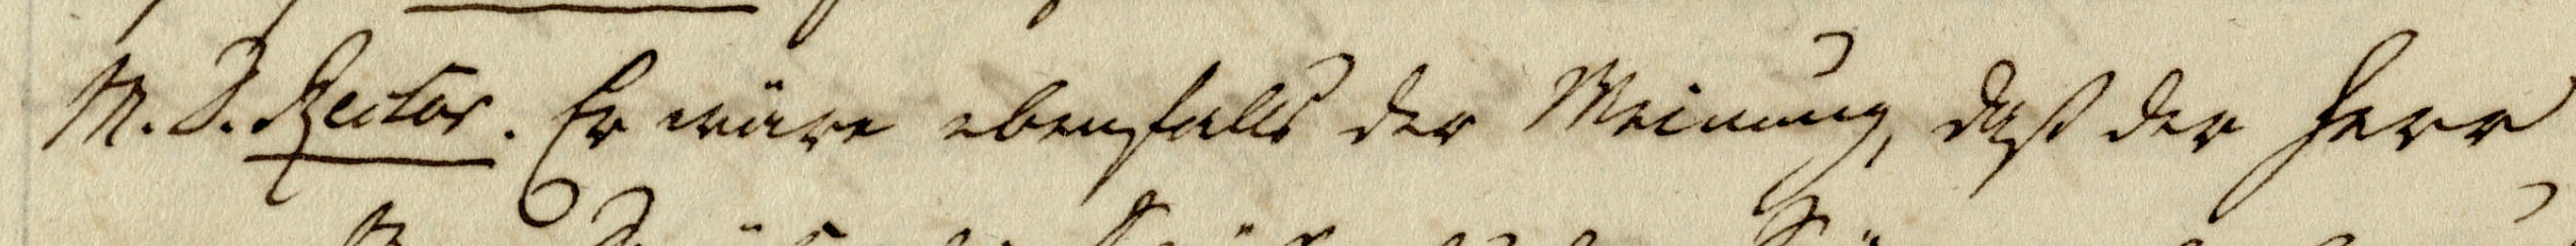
M. D. Rector. Er wäre ebenfalls der Meinung, daß der Herr
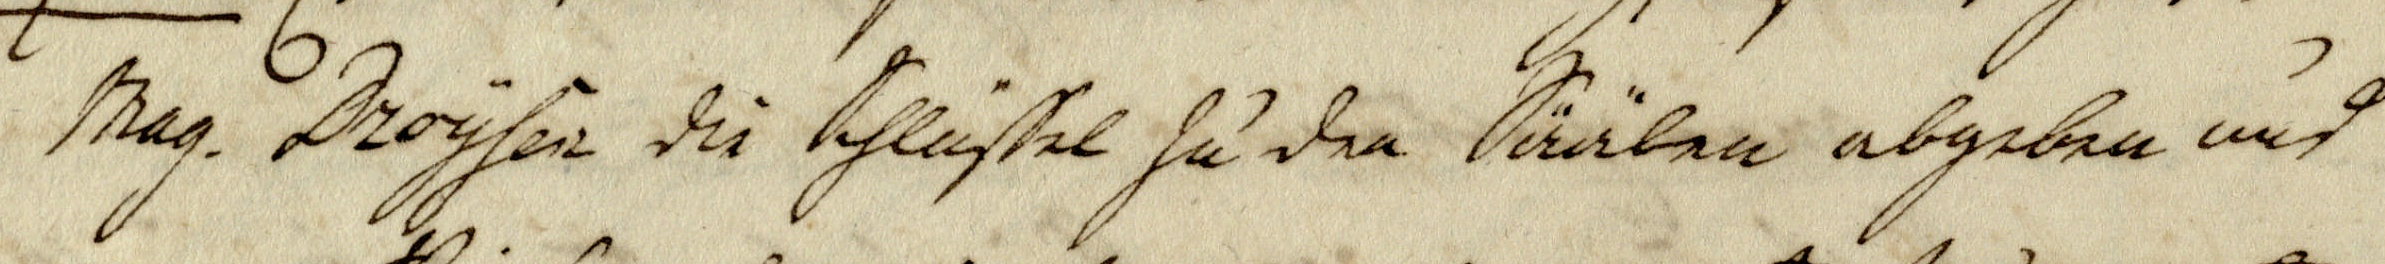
Mag. Droÿsen die Schlüssel zu den Säälen abgeben und
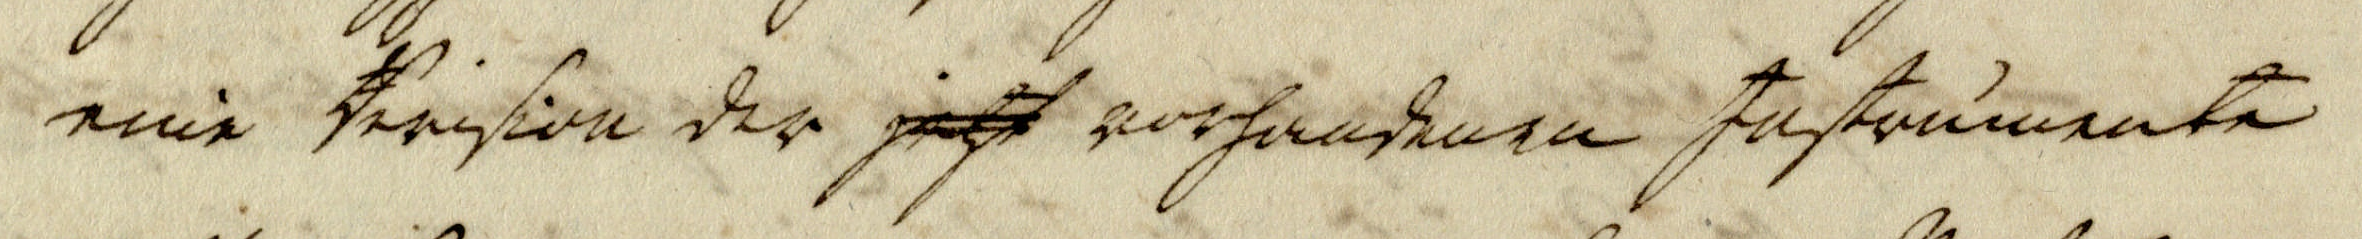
eine Revision der jetzt vorhandenen Instrumente
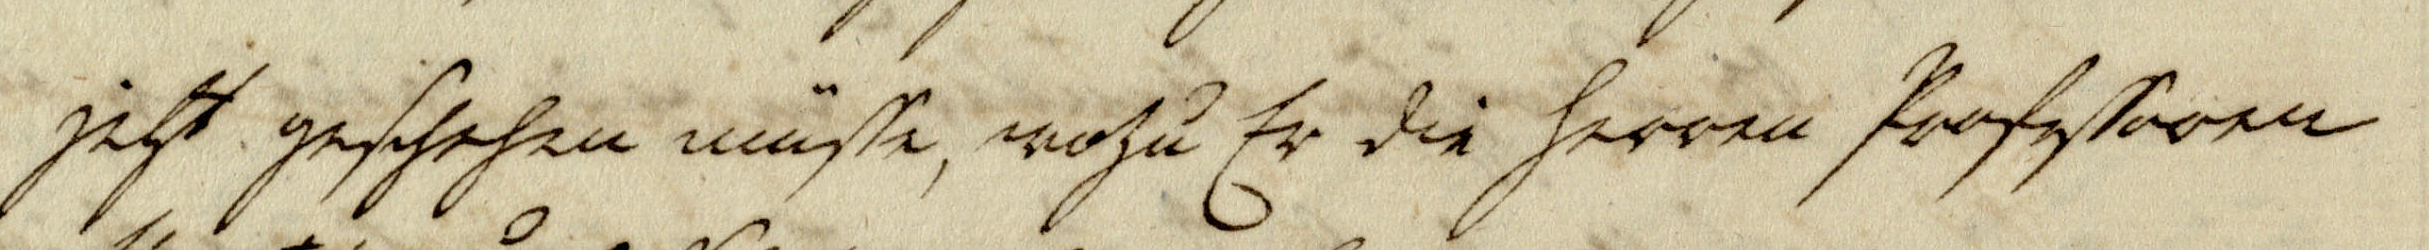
jetzt geschehen müsse, wozu Er die Herren Professoren
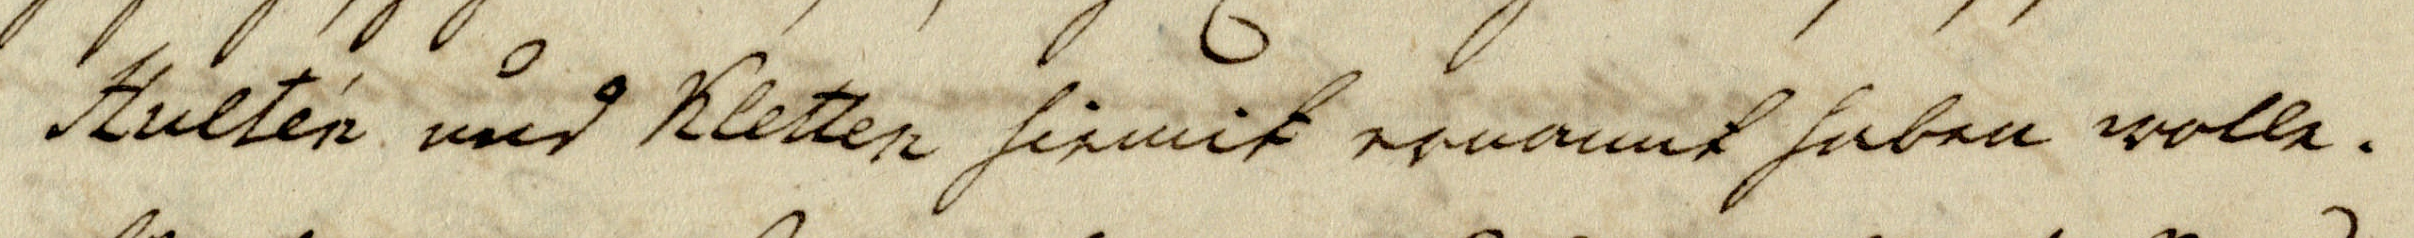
Hultén und Kletten hiemit ernannt haben wolle.
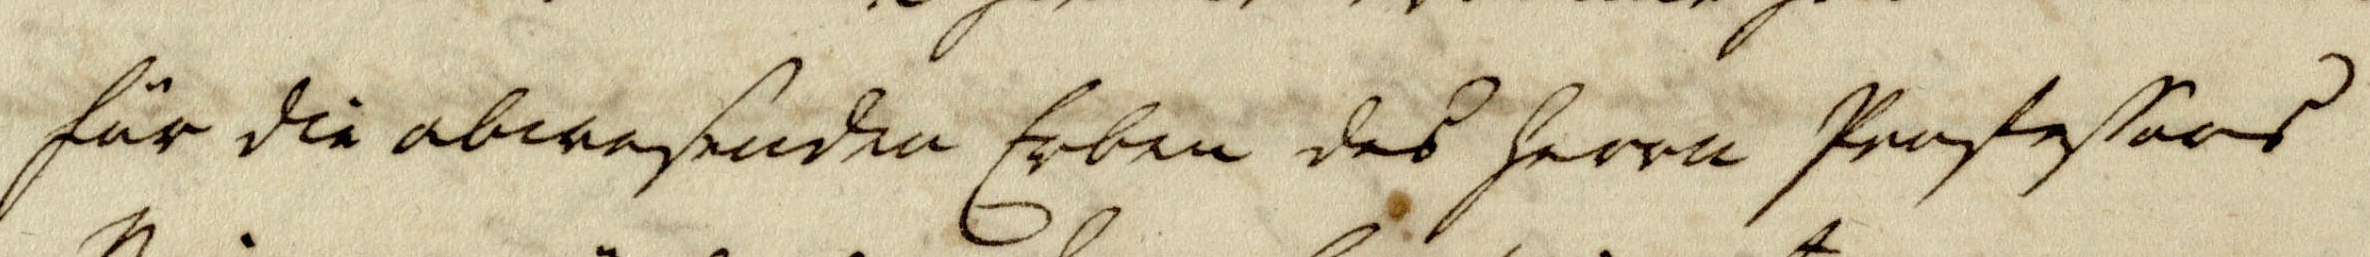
Für die abwesenden Erben des Herrn Professors
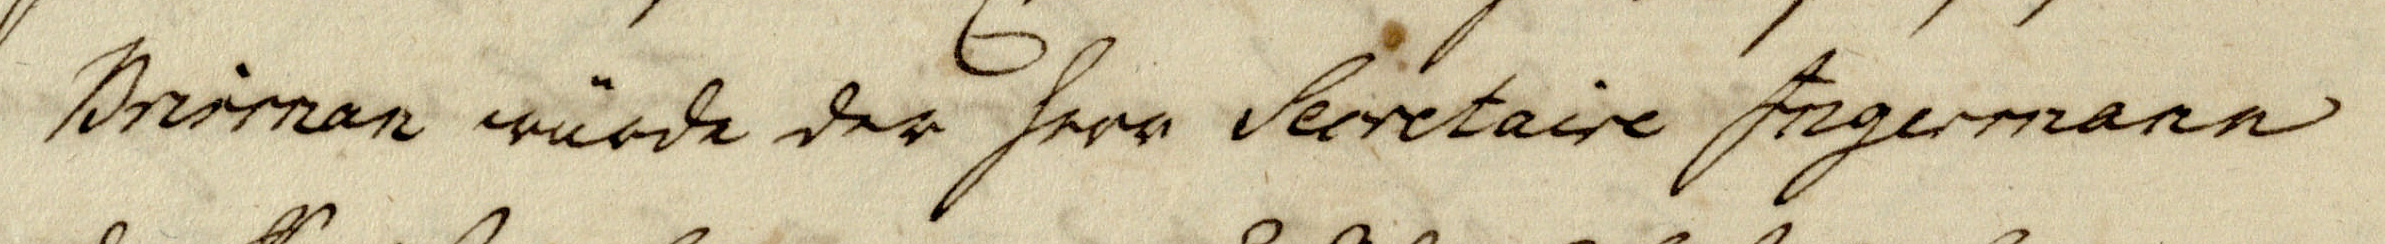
Brisman würde der Herr Secretaire Ingermann
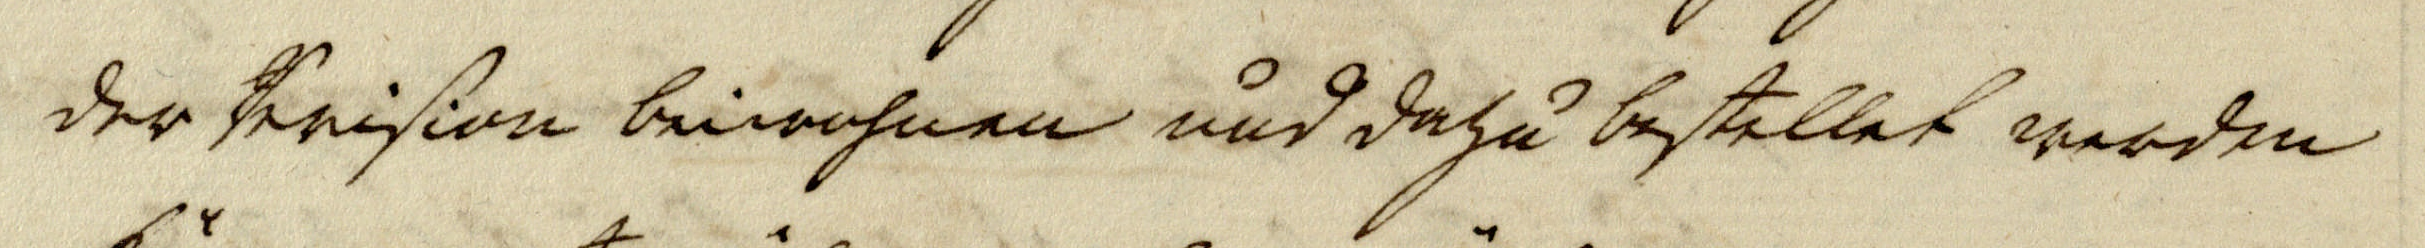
der Revision beiwohnen und dazu bestellet werden
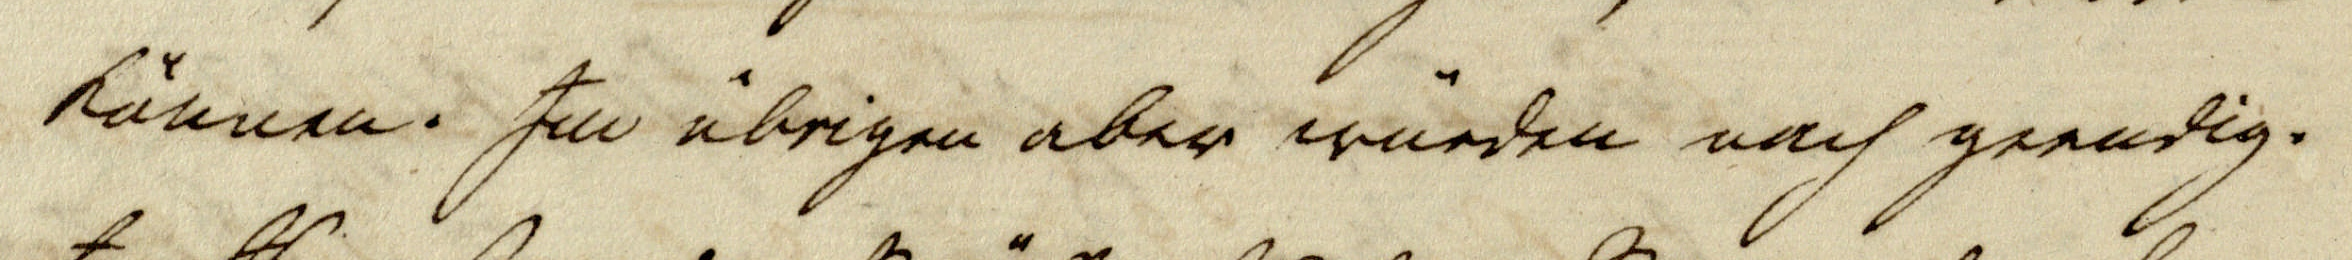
können. Im übrigen aber würden nach geendig¬
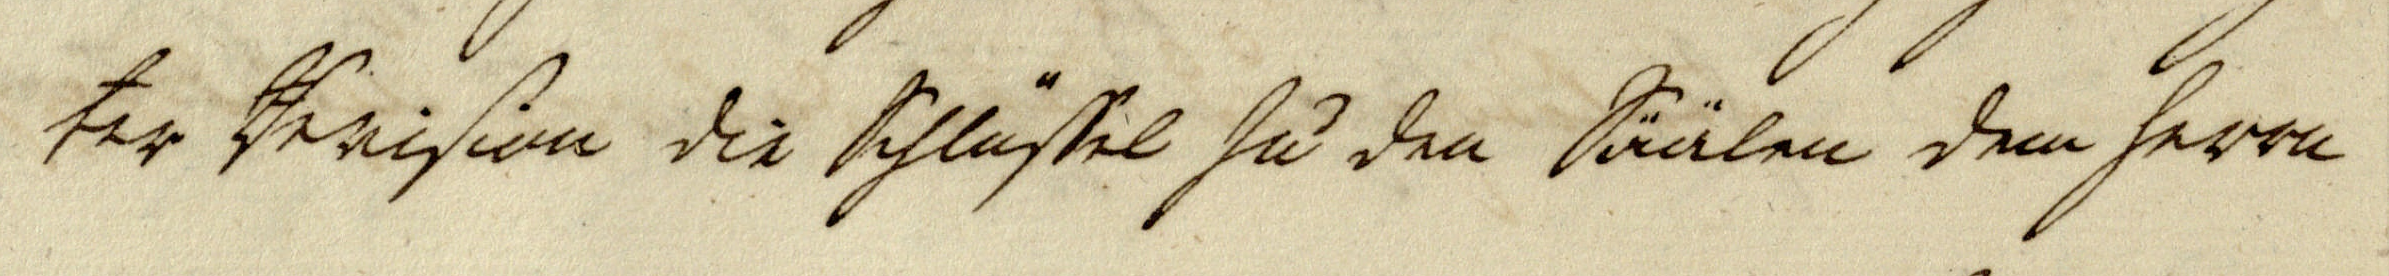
ter Revision die Schlüssel zu den Säälen dem Herrn
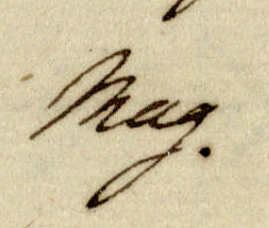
Mag.
